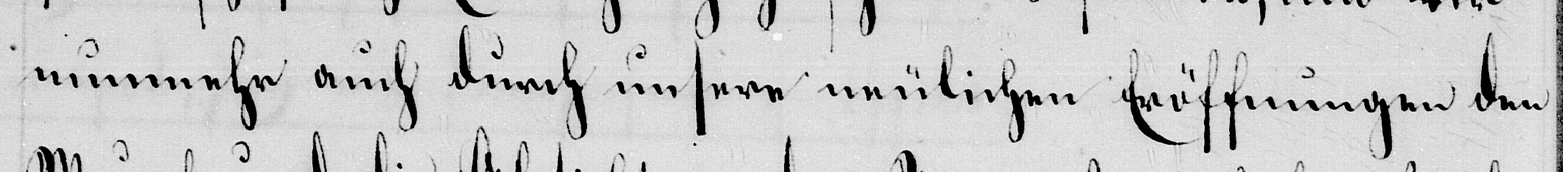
nunmehr auch durch unsere neulichen Eröffnungen den
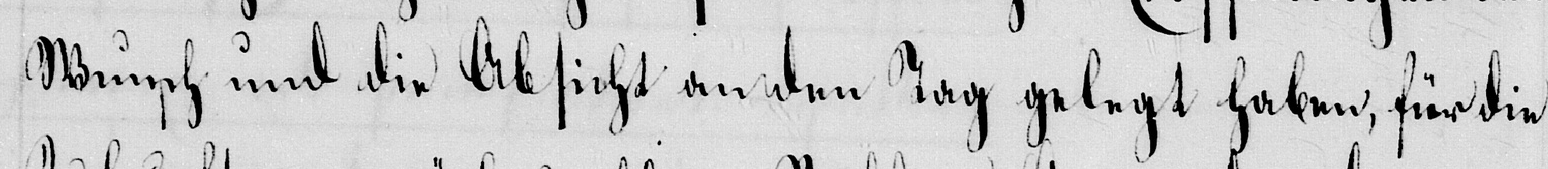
Wunsch und die Absicht an den Tag gelegt haben, für die
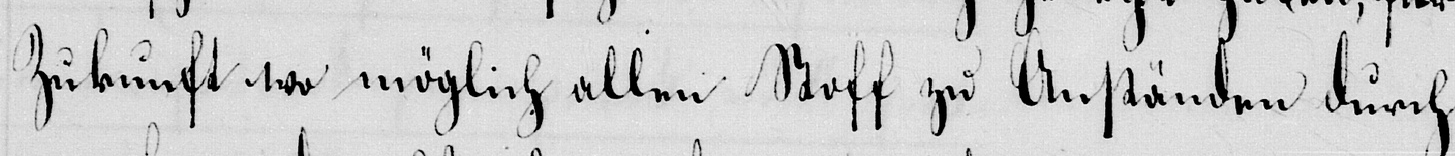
Zukunft wo möglich allen Stoff zu Anständen durch
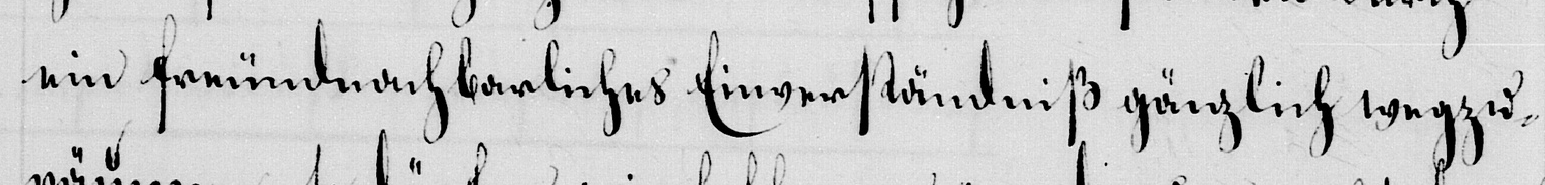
ein freundschaftliches Einverständniß gänzlich wegzu¬
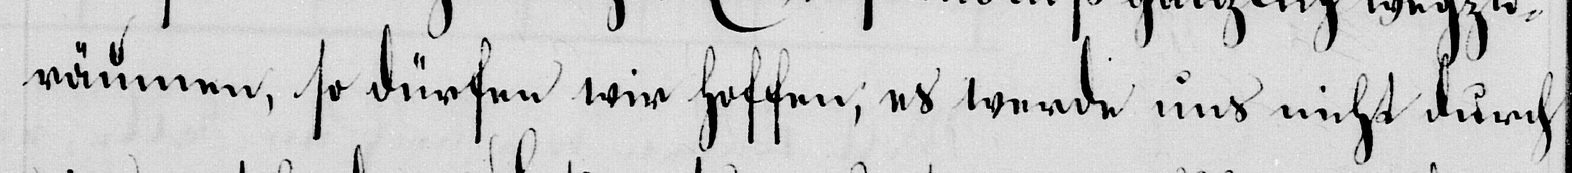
räumen, so dürfen wir hoffen, es werde uns nicht durch
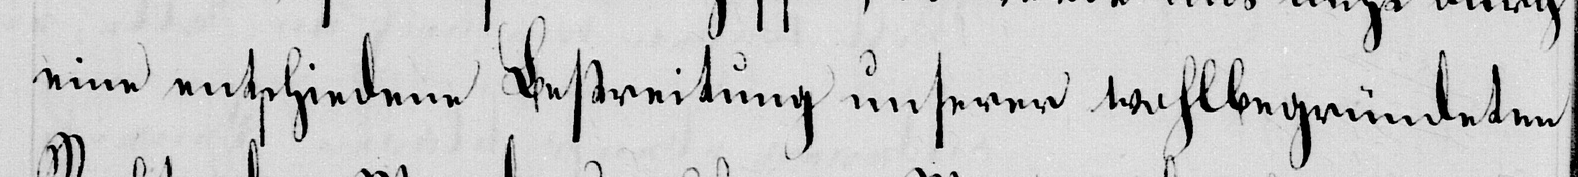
eine entschiedene Bestreitung unserer wohlbegründeten
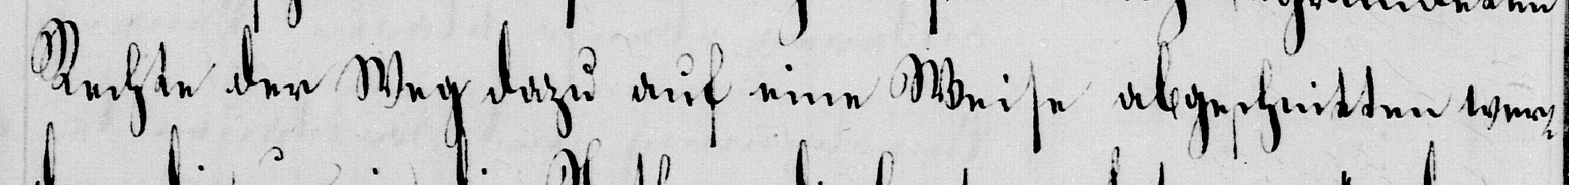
Rechte der Weg dazu auf eine Weise abgeschnitten wer¬
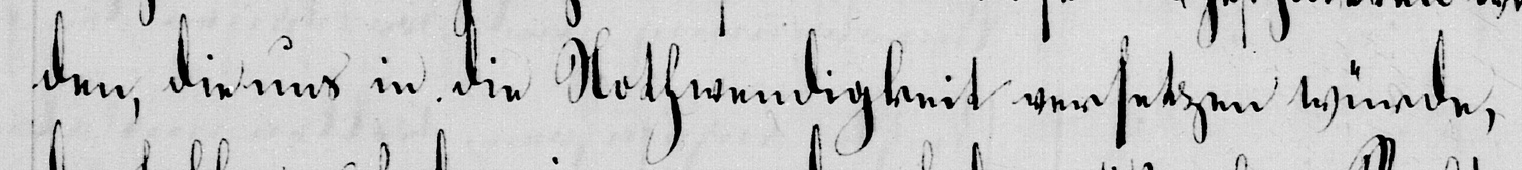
den, die uns in die Nothwendigkeit versetzen würde,
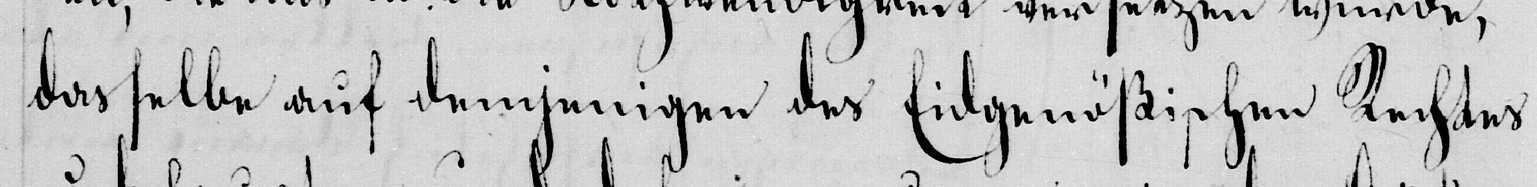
dasselbe auf demjenigen des Eidgenößischen Rechtes
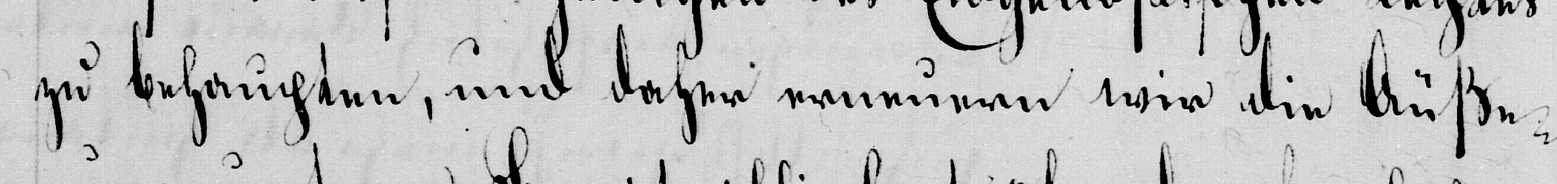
zu behaupten, und daher erneuern wird die Äuße¬
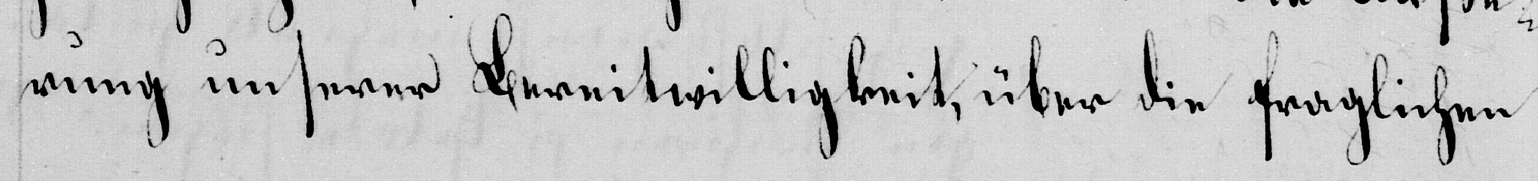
rung unserer Bereitwilligkeit, über die fraglichen
